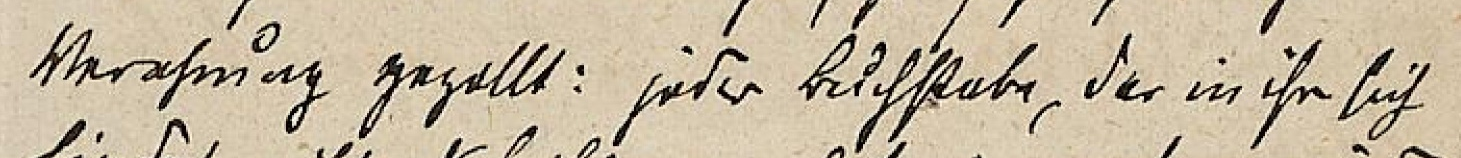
Verehrung gezollt: jeder Buchstebe, der in ihr sich
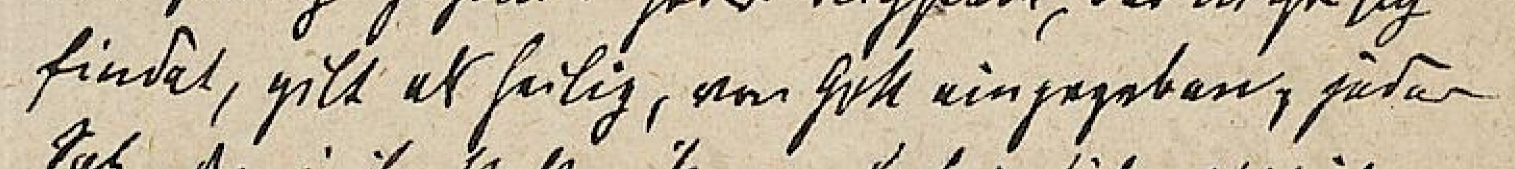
findet, gilt als heilig, von Gott eingegeben, jeder
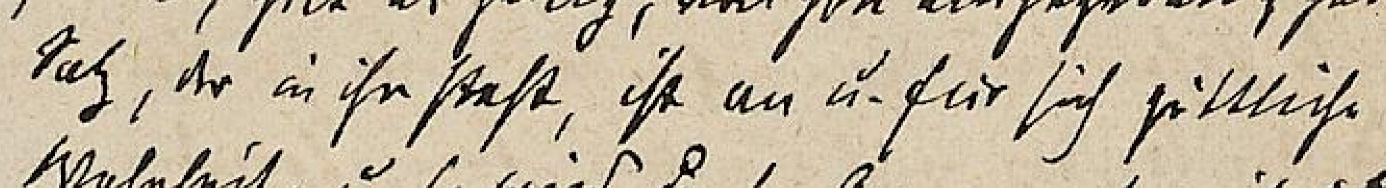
Salz, dr in ihr steht, ist an u. für sich göttliche
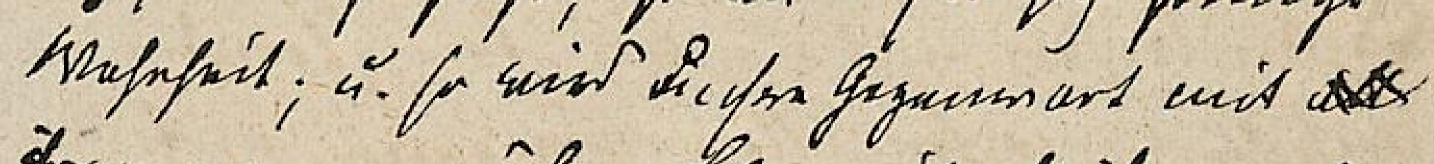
Wahrheit u. so wird unsre Gegenweart mit all
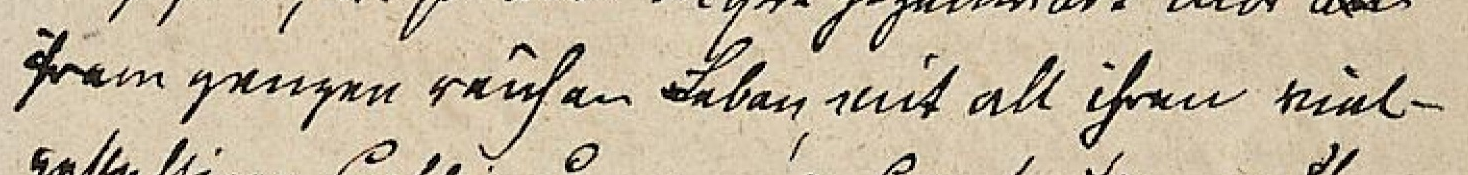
ihrem ganzen reichen Leben, mit all ihren viel¬
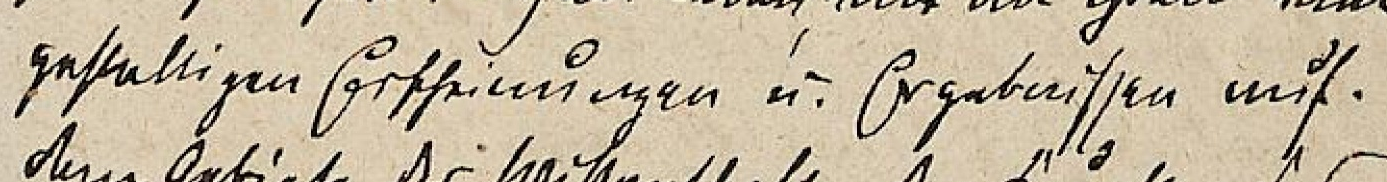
gehaltigen Erscheinungen u. Ergebnissen auf.
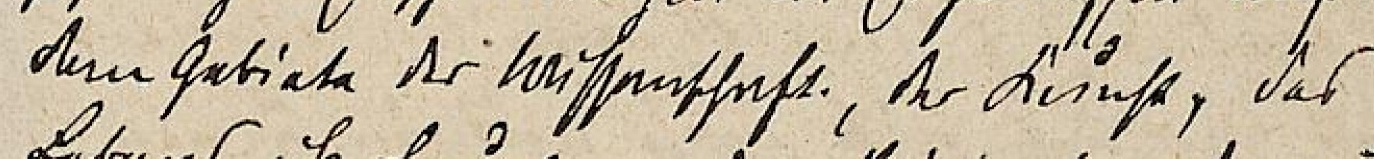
dem Gebiete der Wissenschaft., der Kunst, des
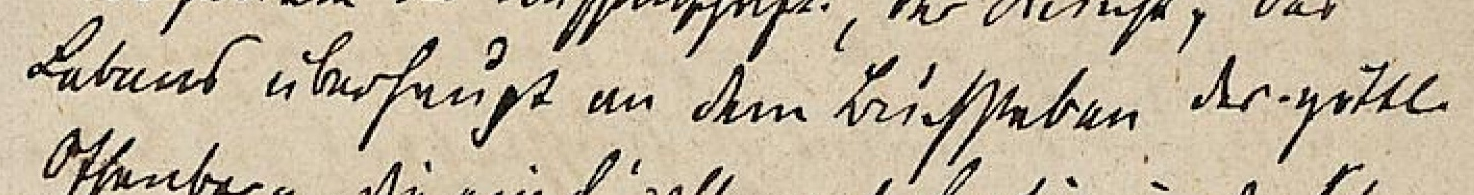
Lebens überhaupt an dem Buchstaben der göttl.
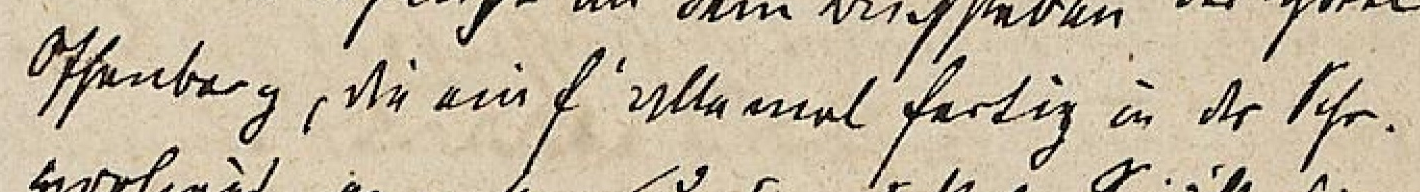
Offenbarg, die ein f allemal fertig in dr Schr.
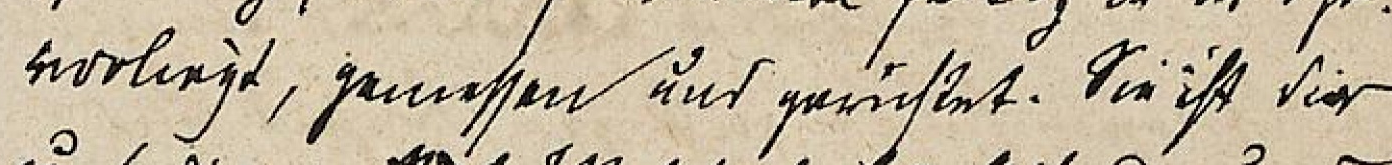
vorliegt, gemessen und gerüstet. Sie ist der
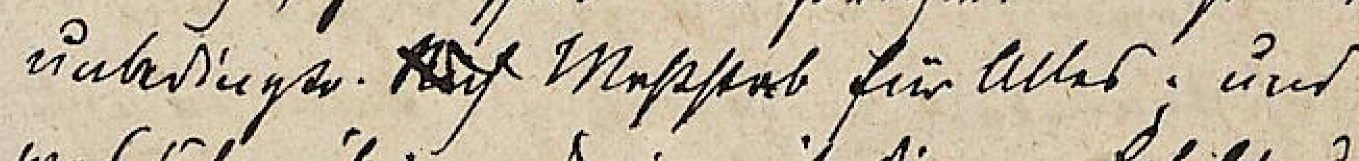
unbedingte. Reich Maßstab für Alles. und
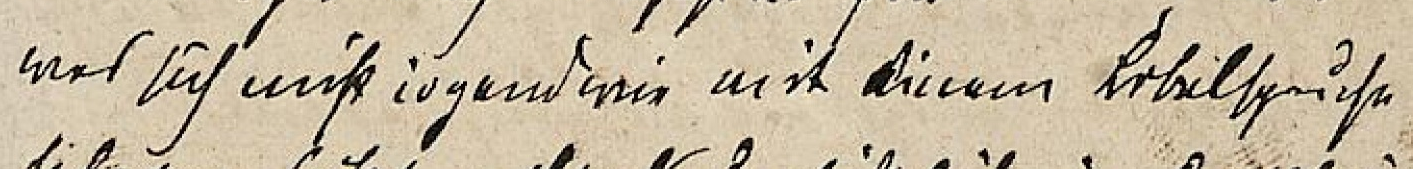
was sich nicht irgendwie mit einem Bibelspruche
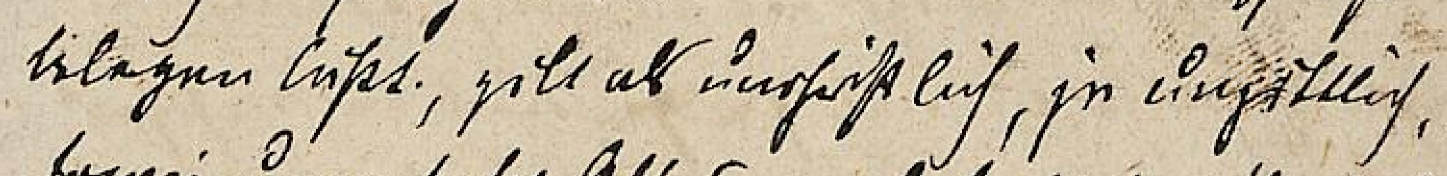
belegen läßt, gilt als unchristlich, ja ungeistlich,
